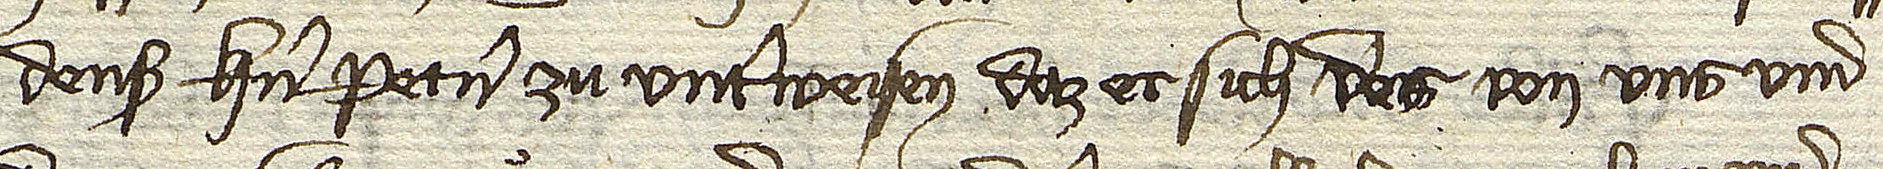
denſ* H*n Pet*n ʒu vnt*weiſen daʒ er ſich des von vns vnd
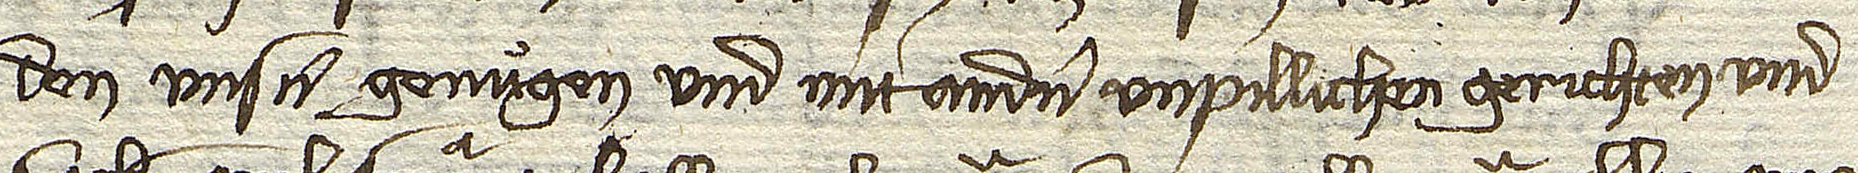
den vnſ*n genügen vnd mit and*n vnpillichen gerichten vnd
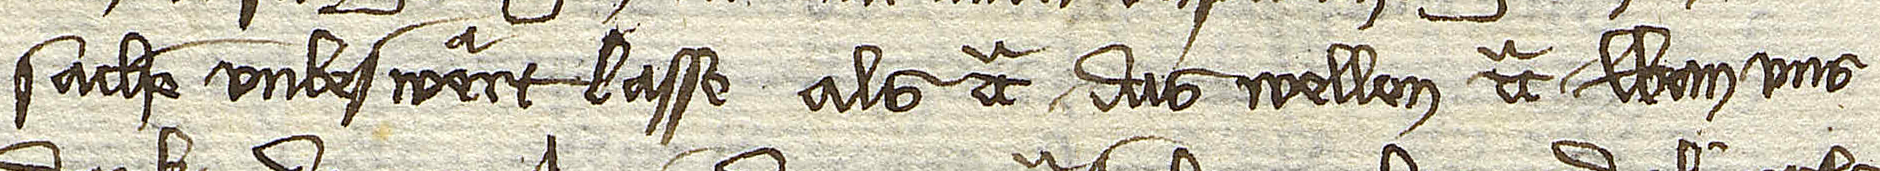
ſache* vnbeſwërt laſſe . als ec* / das wellen ec* / Wan vns
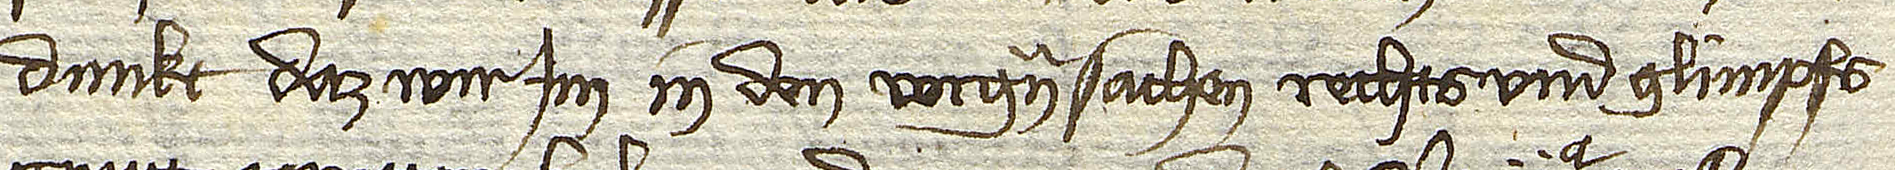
dunkt daʒ wir Im in den vorg*n ſachen rechts vnd glimpfs
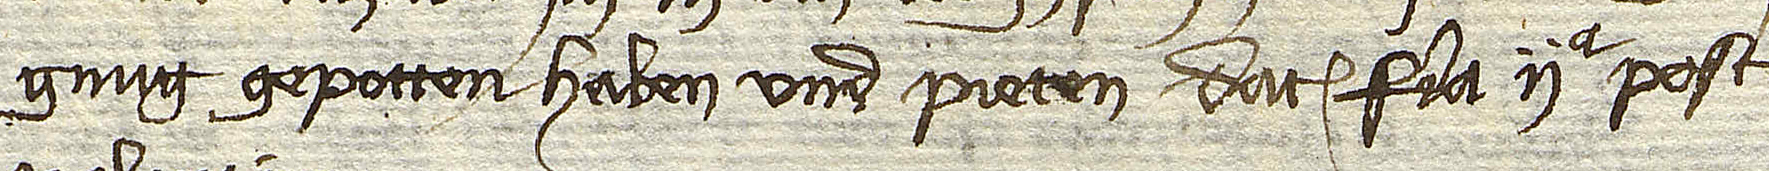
gnug gebotten haben vnd pieten / Dat* fia* ii* poſt
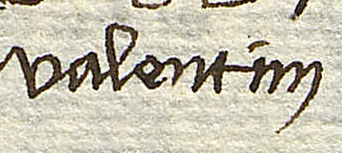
valentini
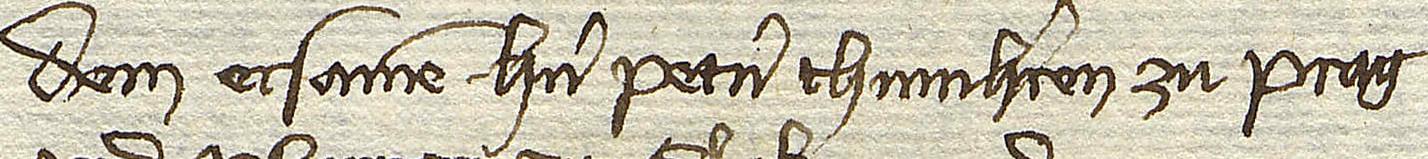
Dem erſame* h*n Pet*n thumh*ren ʒu Prag
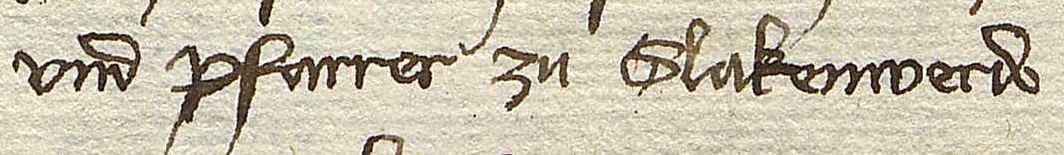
vnd pfarrer ʒu Slakenwerde
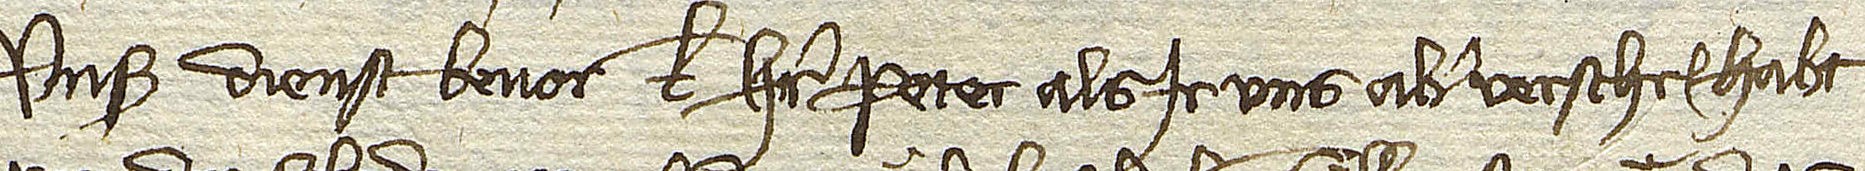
Vnſ* dienſt beuor l* h*r Peter als Ir vns ab* verſchr* habt
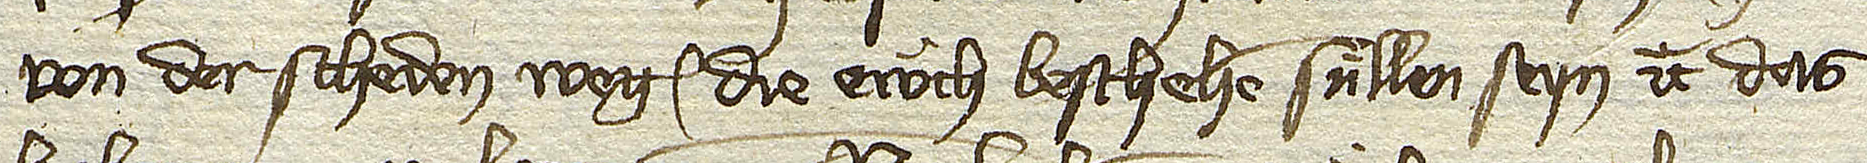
von der ſcheden weg* die ewch beſchehe* ſüllen ſeyn ec* das
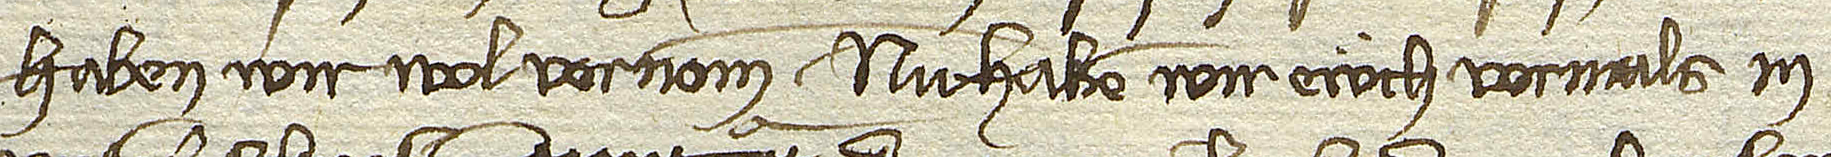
haben wir wol vernom* / Nu habe* wir ewch vormals in
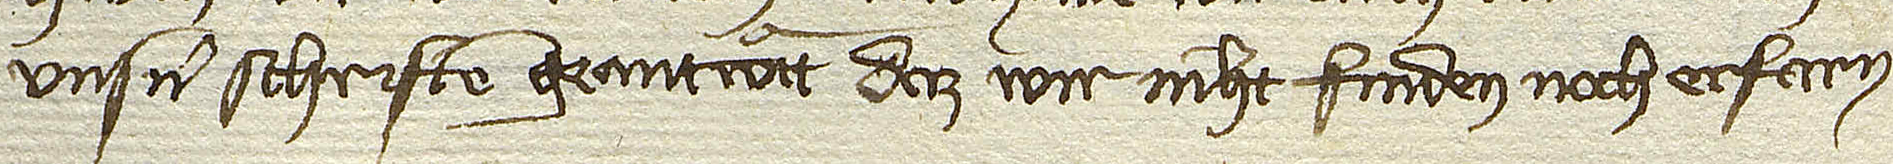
vnſ*n ſchrifte* geantw*tt daʒ wir niht finden noch erfarn
